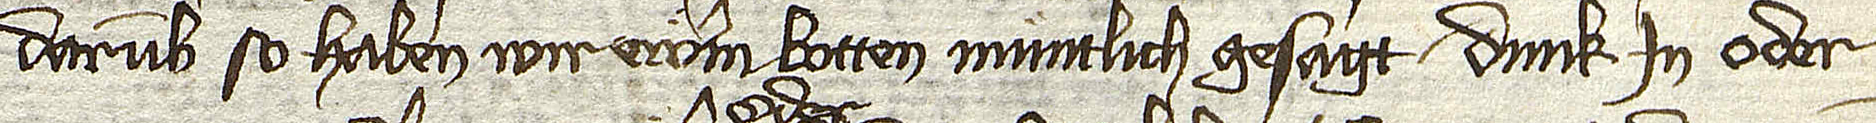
daru*b ſo haben wir ew*m botten müntlich geſagt / Dunk In oder
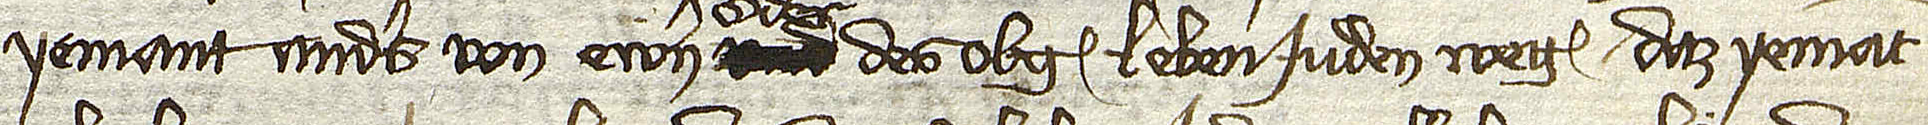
yemant and*s von ew*n vnd des obg* leben Iuden weg* / daʒ yema*t
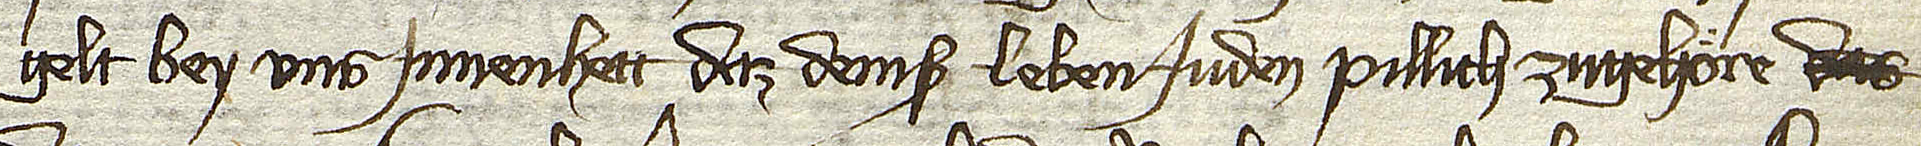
gelt bey vns Innenhett daʒ demſ* leben Iuden pillich ʒugehöre das
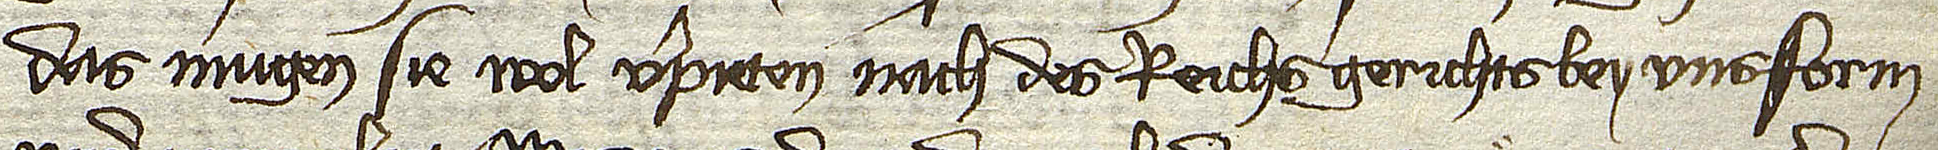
das mugen ſie wol v*pieten nach des Reichs gerichts bey vns form
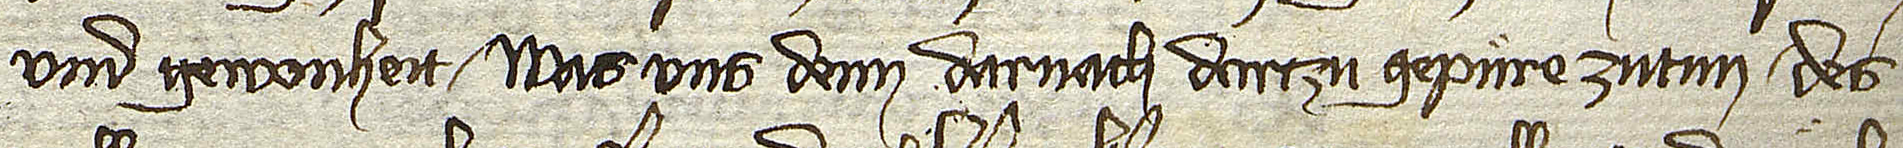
vnd gewonheit / Was vns denn darnach darcʒu gepüre ʒutun / des
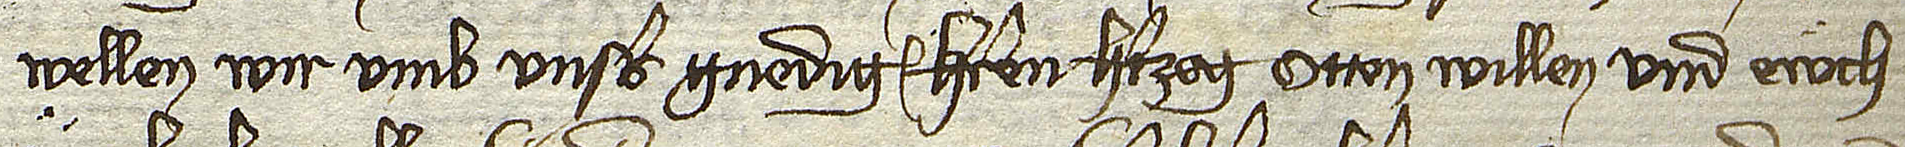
wellen wir vmb vnſ*s gnedig* h*ren h*cʒog Otten willen vnd ewch
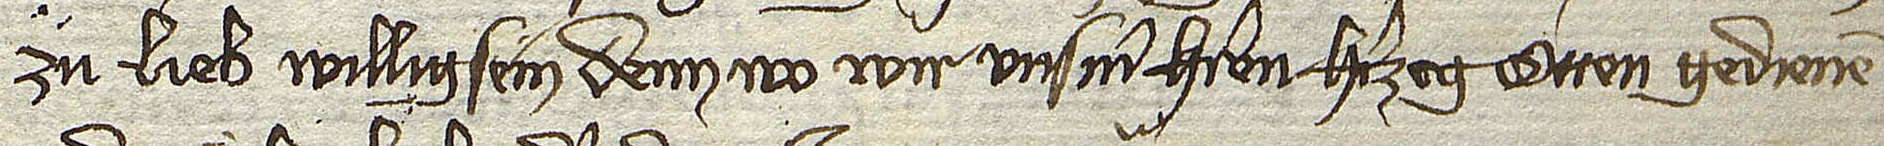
ʒu lieb willig ſein Denn wo wir vnſ*m h*ren h*cʒog Otten gediene*
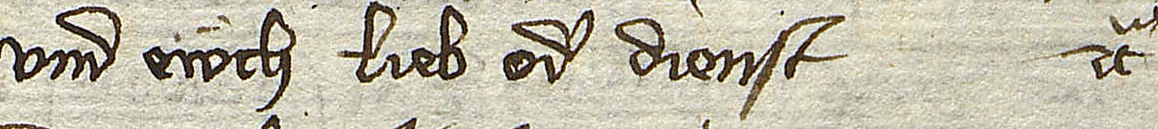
vnd ewch lieb od* dienſt ec*
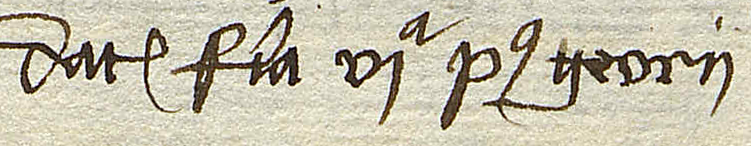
Dat* fia* vi* p* georii
